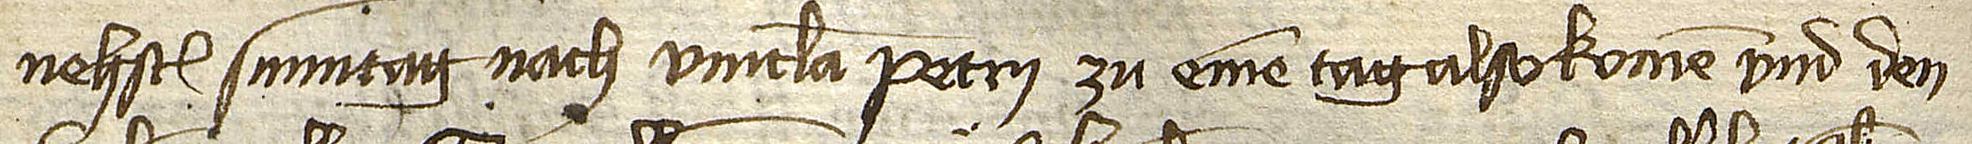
nehſt* ſunntag nach vinc*la Petri ʒu eine* tag alſo kome* vnd den
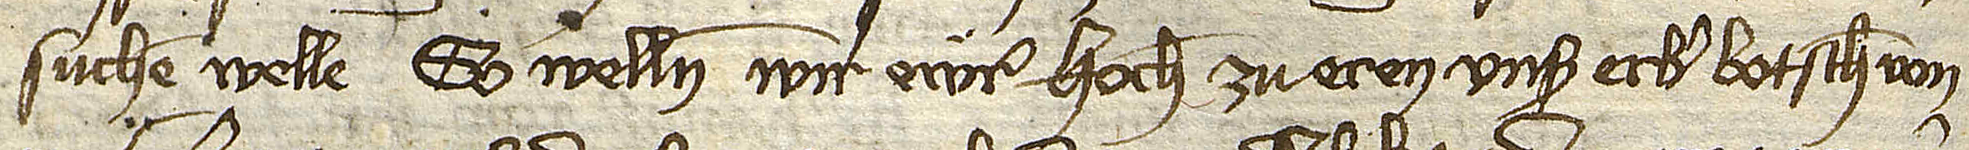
ſuche* welle So welln* wir eẅr* hoch* ʒu eren vnſ* erb* botſch* von
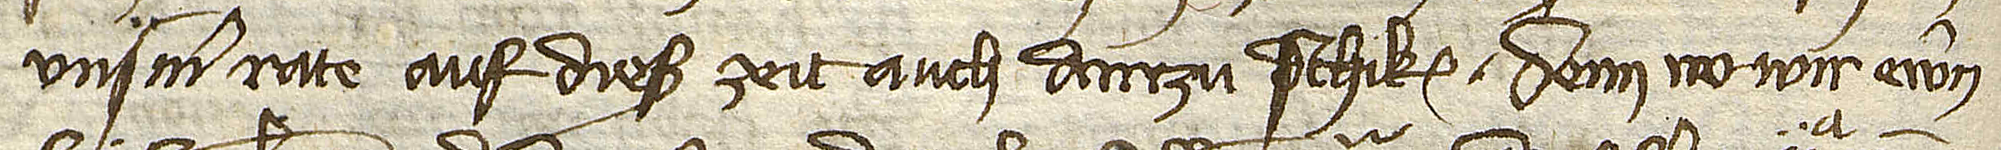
vnſm* rate auf dieſ* ʒeit auch darcʒu ſchik* / Denn wo wir ew*n
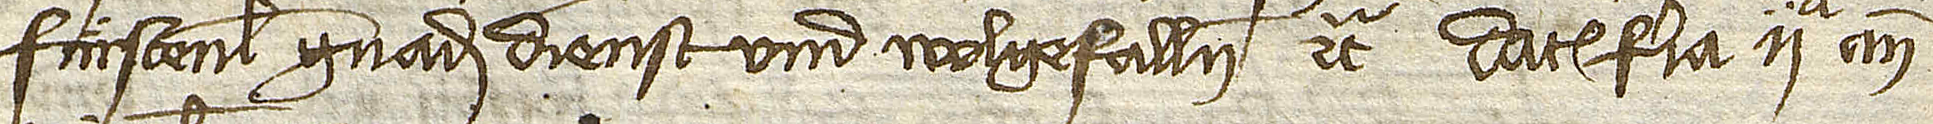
fürſtenl* gnad* dienſt vnd wolgefalln* ec* Dat* fi*a ii* an*
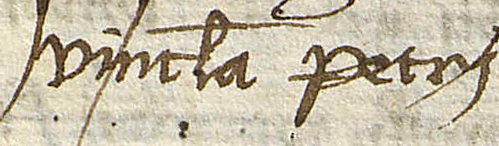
vinc*la Petri
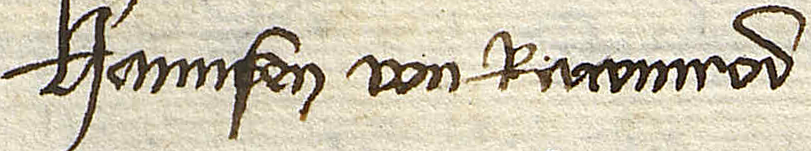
Hannſen von Rawmrod
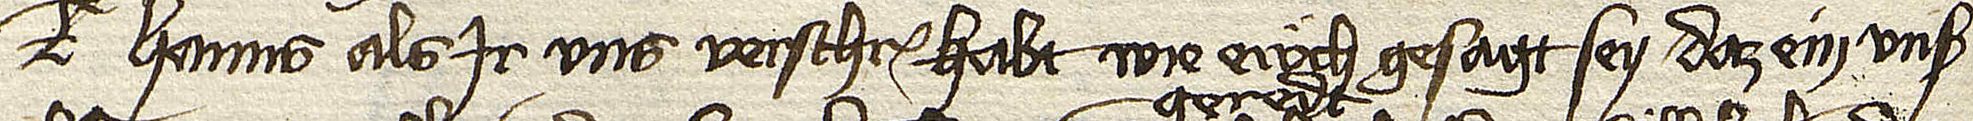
L* hanns als Ir vns verſchr* habt wie eẅch geſagt ſey / daʒ ein vnſ*
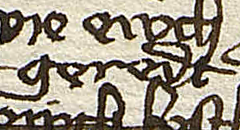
geredt
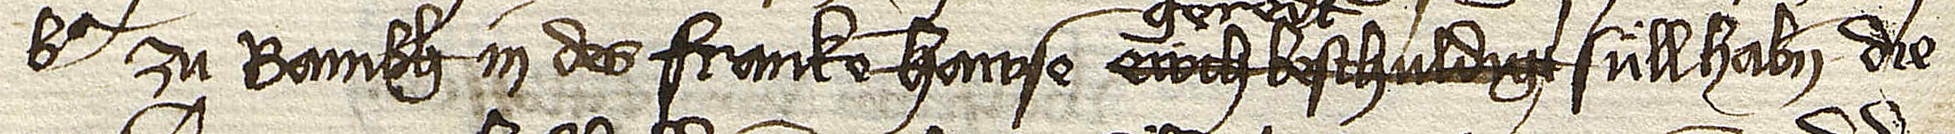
b* ʒu Bamb*g in des Franke* hawſe eẅch beſchuldigt ſüll habn* / die
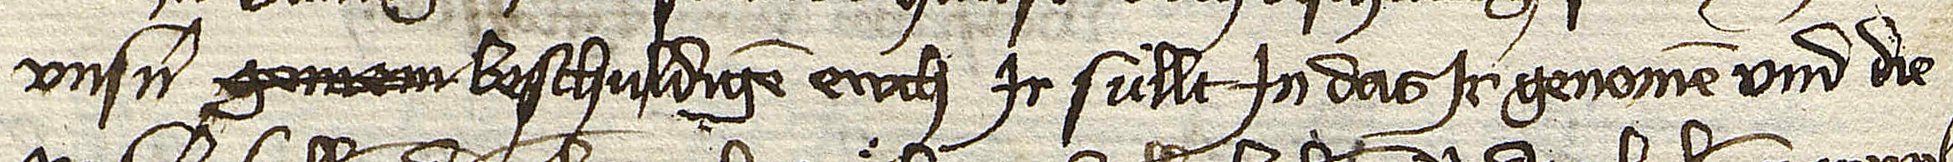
vnſn* gemein beſchuldige* ewch Ir ſüllt In das Ir genome* vnd die
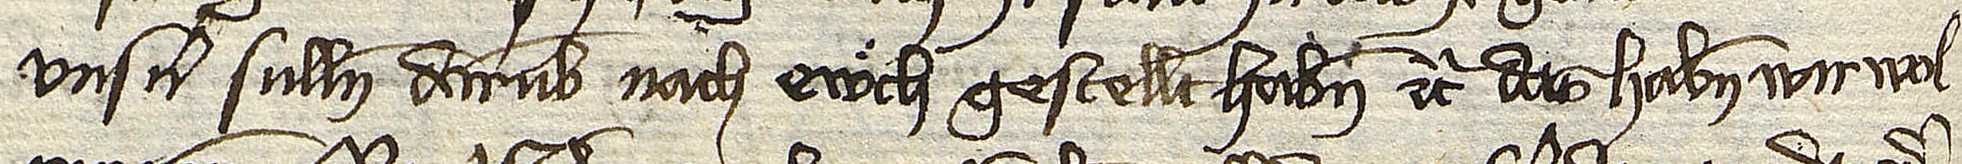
vnſn* ſulln* darub* nach eẅch geſtellt habn* ec* das habn* wir wol
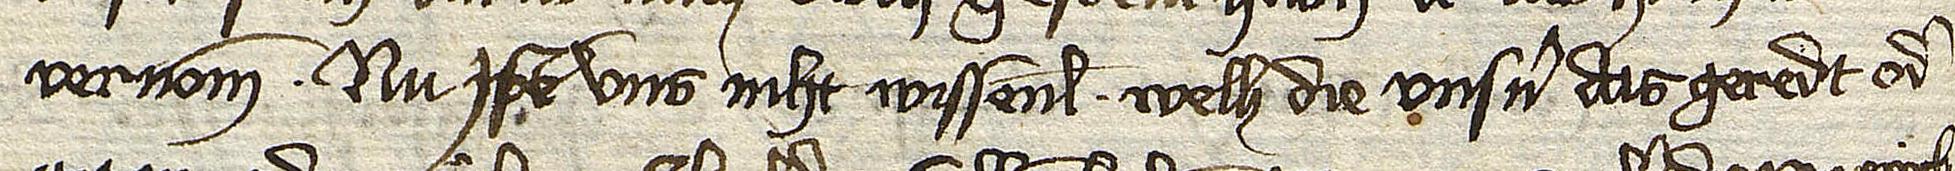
vernom* . Nu Iſt vns niht wiſſenl* . welh die vnſn* das geredt od*
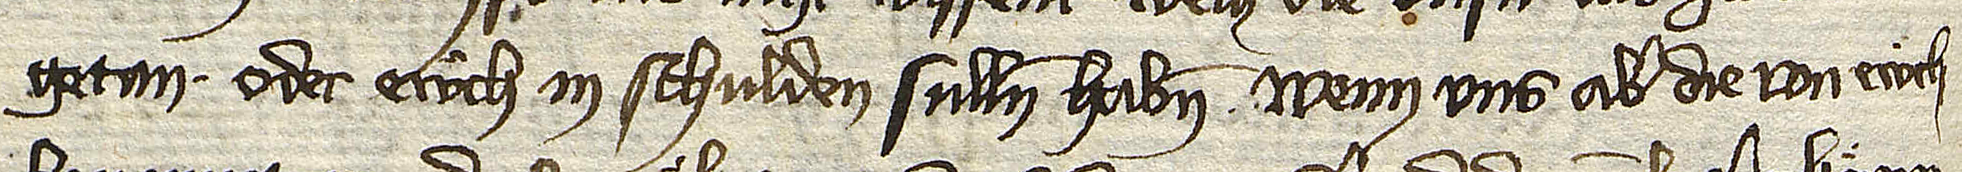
getan . oder eẅch in ſchulden ſulln* habn* wenn vns ab* die von eẅch
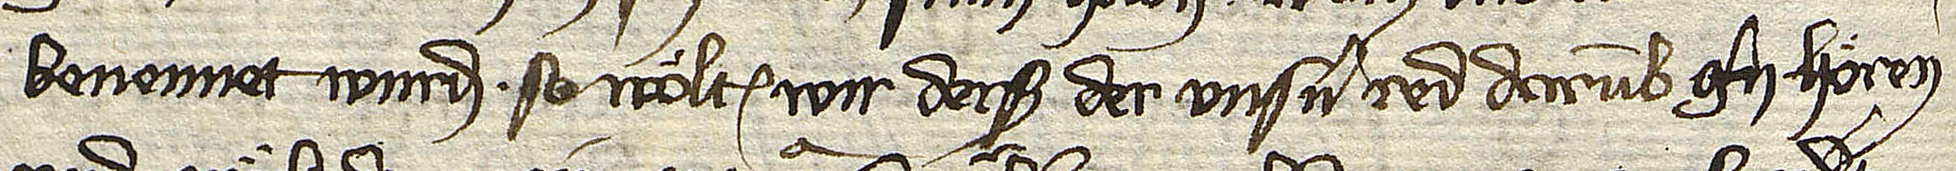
benennet wurd* . ſo wölt* wir derſ* der vnſn* red darub* g*n hören
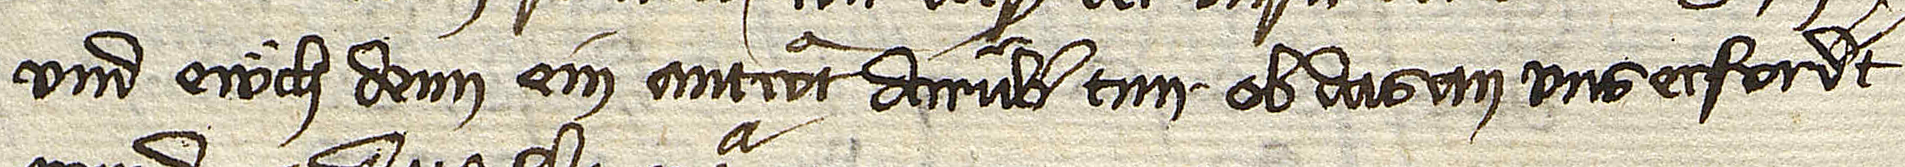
vnd eẅch denn ein antw*t darüb* tun . ob das an vns erford*t
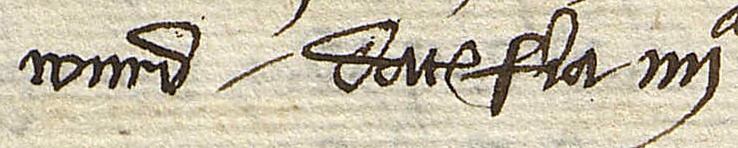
wurd / Dat* fi*a iiii*
